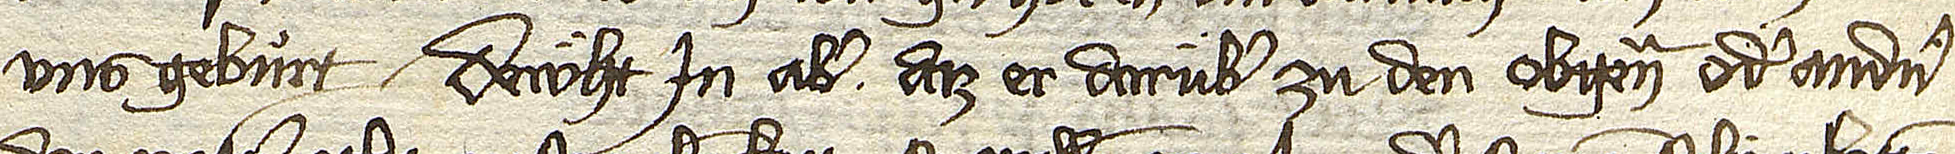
vns gebürt / Deẅht In ab* . daʒ er darüb* ʒu den obgen* od* andn*
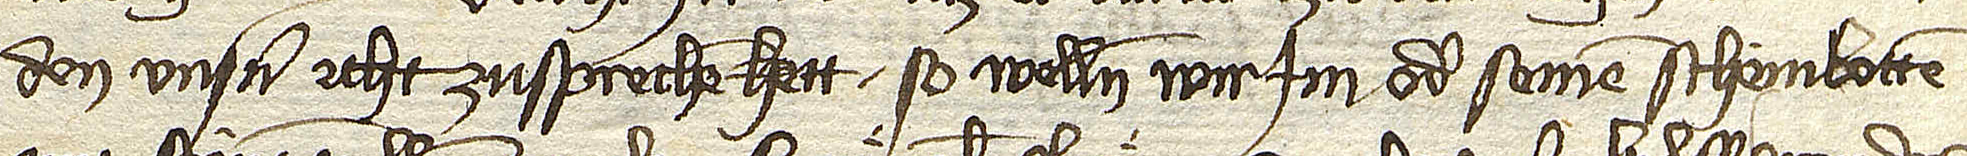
den vnſn* icht ʒuſpreche* hett / ſo welln* wir Im od* ſeine* ſcheinbotte*
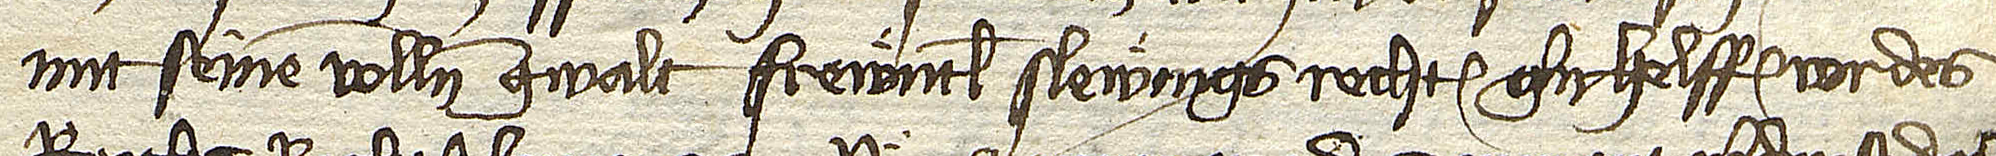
mit ſeine* volln* gwalt freẅntl* ſleẅnigs recht* g*n helff* vor des
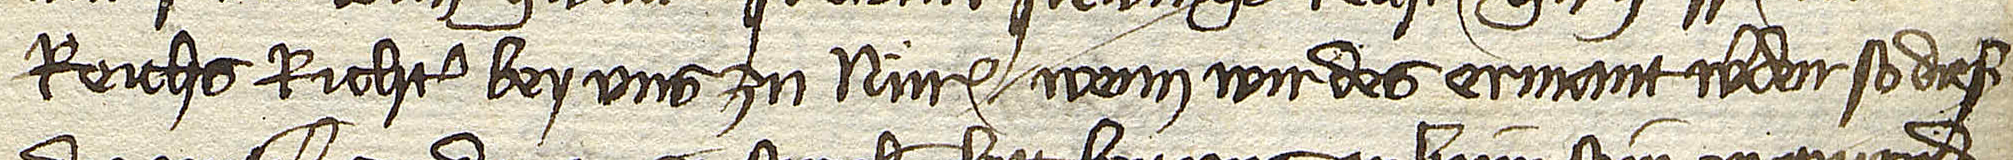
Reichs Richt* bey vns ʒu Nür* / wenn wir des ermant w*den ſo dieſ*
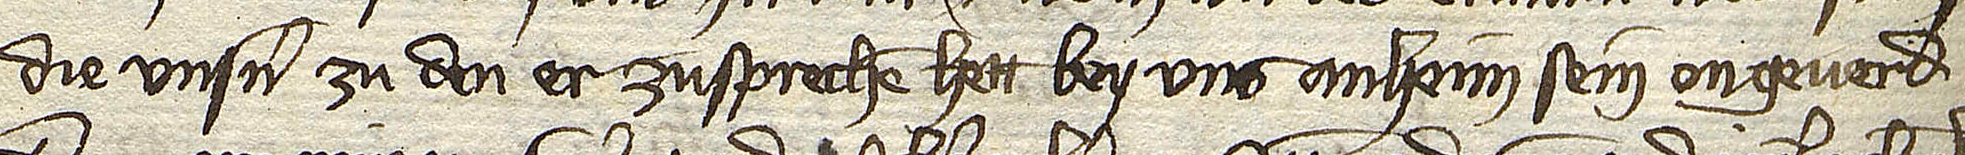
die vnſn* ʒu den er ʒuſpreche* hett bey vns anheim ſein ongeuerd*
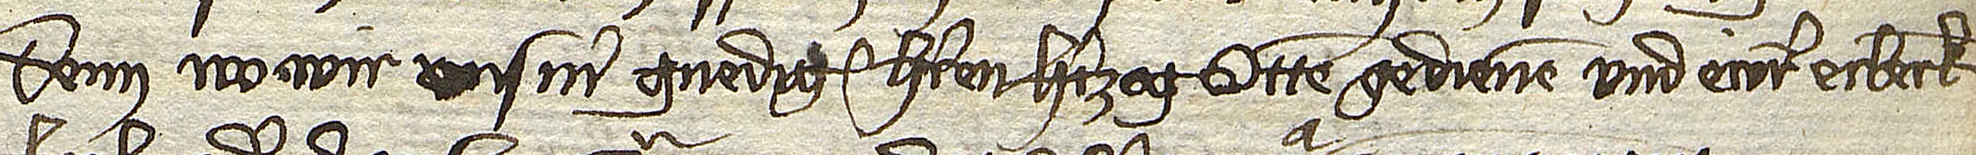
Denn wo wir vnſm* gnedig* h*ren h*cʒog Otte* gediene* vnd eẅr* erberk*
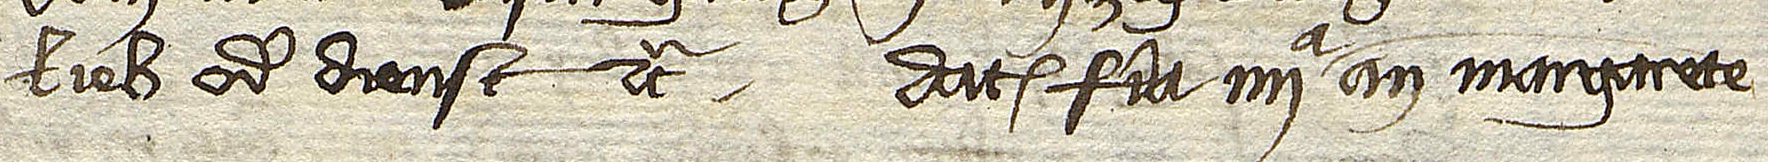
lieb od* dienſt ec* / dat* fi*a iiii* an* margarete
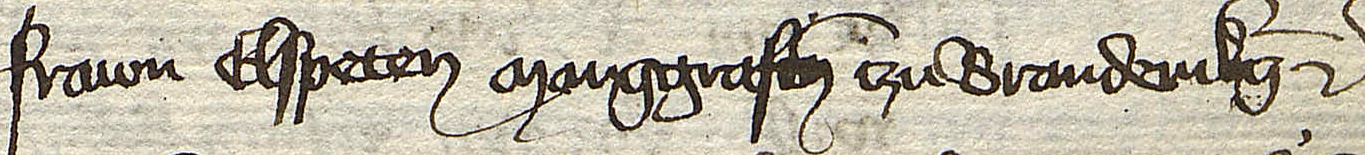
frawn Elſpeten Marggrafin* cʒu Brandemb*g ec*
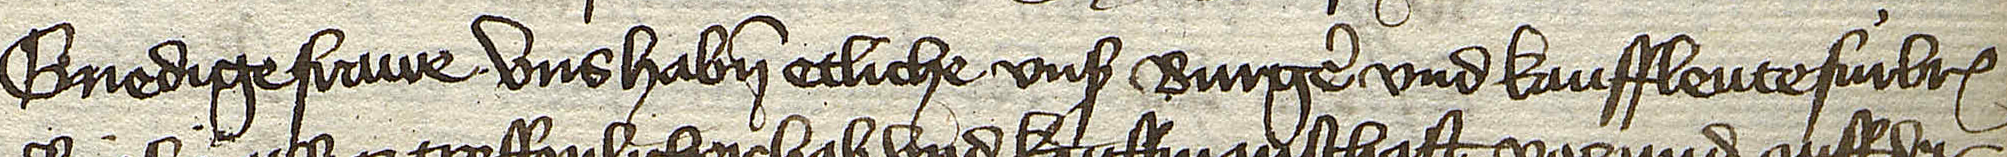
Gnedige frawe Vns habn* etliche vnſ* Burge* vnd kaufflewte fürbr*
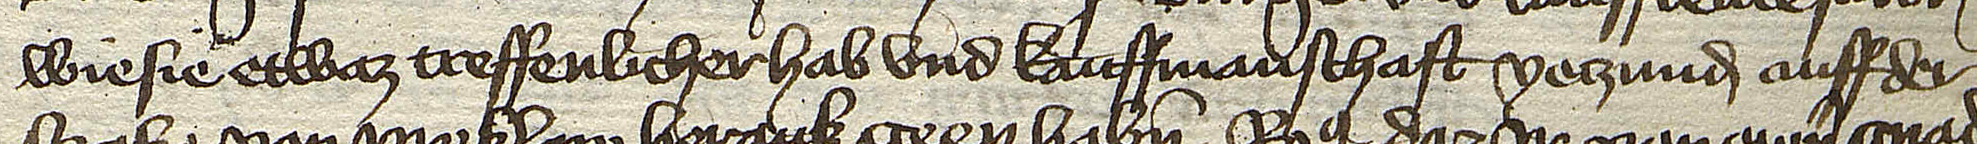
wie ſie etwaʒ treffenlicher hab vnd kauffmanſchaft yecʒund* auff der
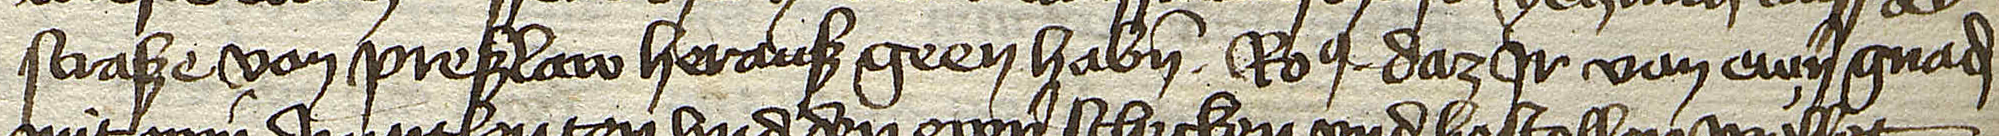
ſtraſʒe von preſʒlaw herauſʒ geen habn* / Ro* / daʒ Ir von ewn* gnad*
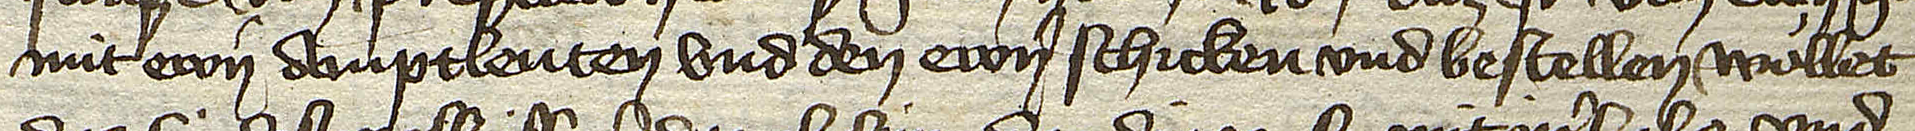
mit ewn* Amptleuten vnd den ewn* ſchicken vnd beſtellen wöllet
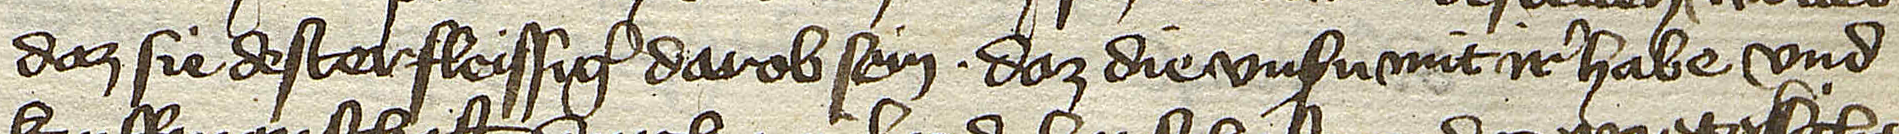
daʒ ſie deſter fleiſſig* darob ſein . daʒ die vnſ*n mit ir* habe vnd
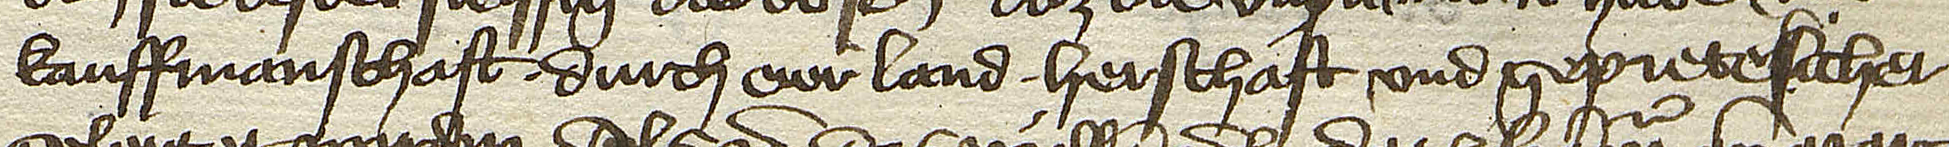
kauffmanſchaft . durch ewr land . herſchaft vnd gepiete ſicher
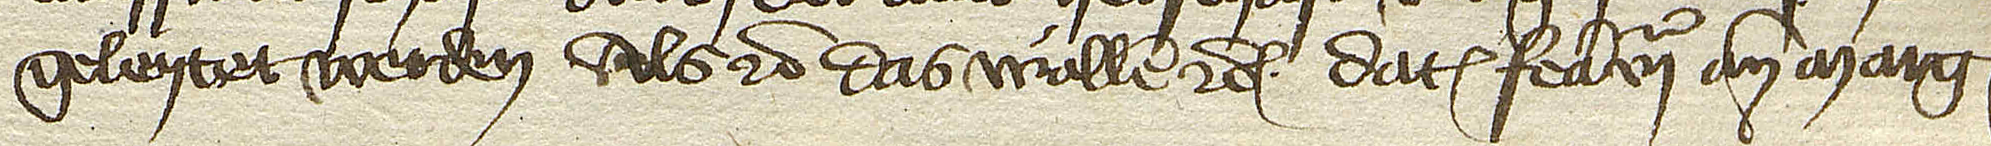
geleytet werden Als ec* Das wölle* ec* . dat* fea* vi* an* Marg*
